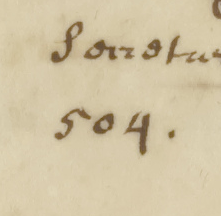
504.
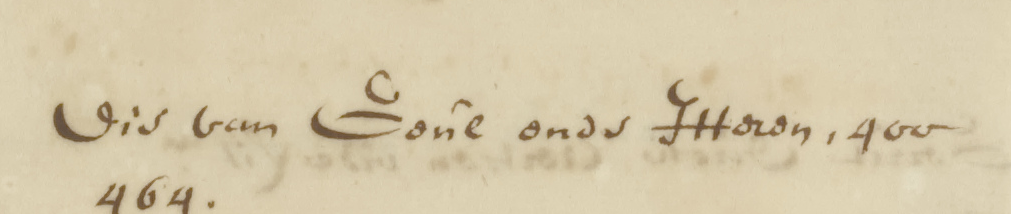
Die van Geul ende Itteren, 400
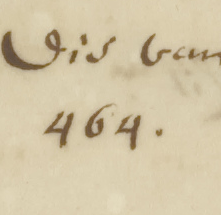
464.
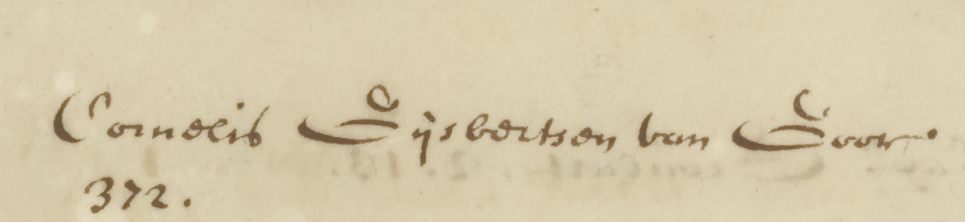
Cornelis Gijsbertsen van Goor
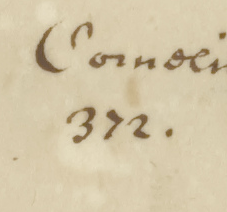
372.
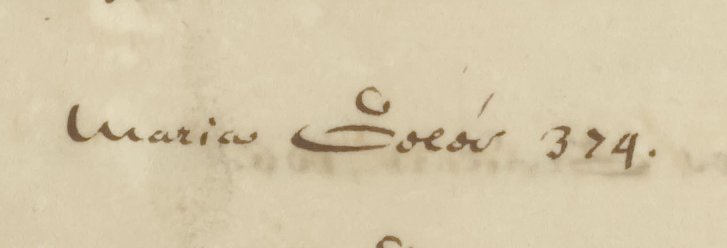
Maria Geler 374.
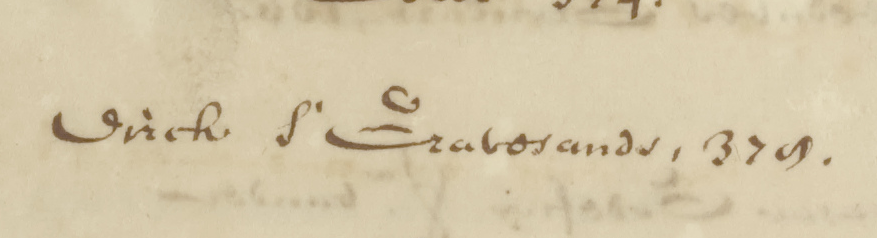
Dirck s'Gravesande, 378.
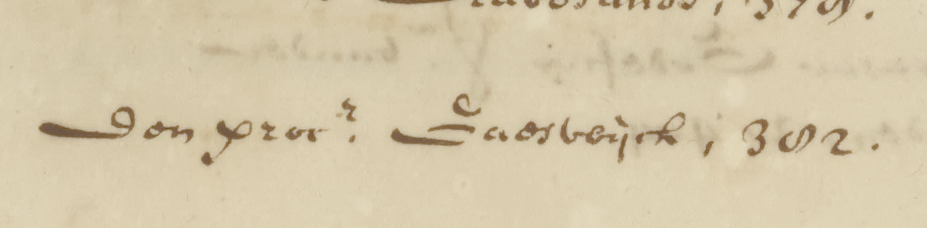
Den procr. Gaeswijck, 382.
